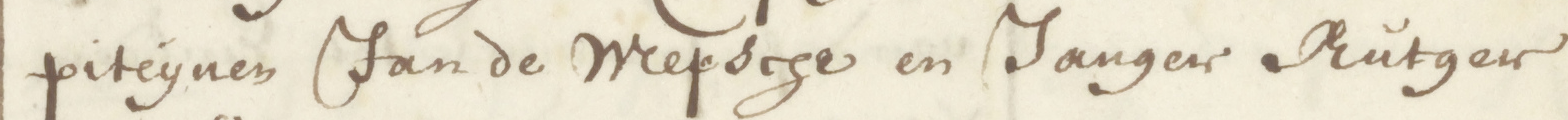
piteijnen Jan de Mepsche en Janger Rutger
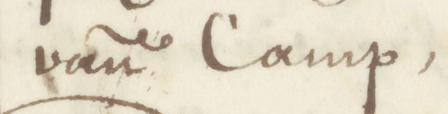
van Camp.
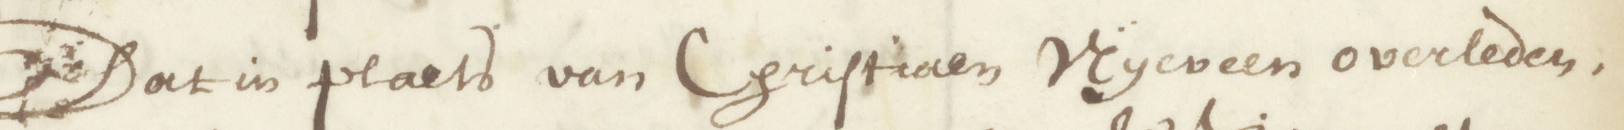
Dat in plaets van Christiaen Nijeveen overleden,
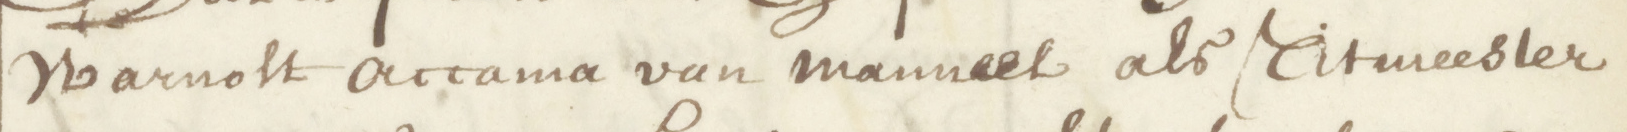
Warnolt Accama van Manneel als Ritmeester
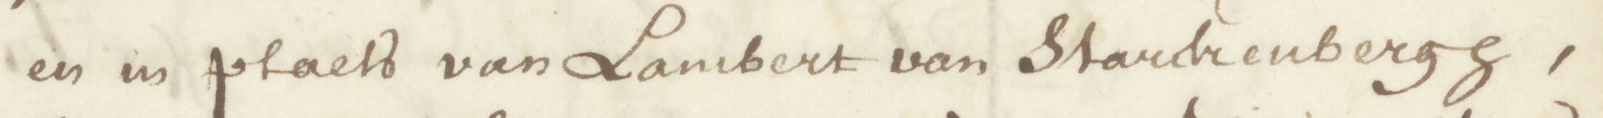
en in plaets van Lambert van Starkenbergh,
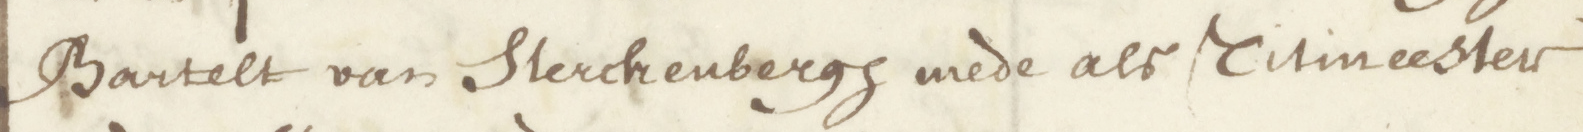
Bartelt van Sterckenbergh mede als Ritmeester
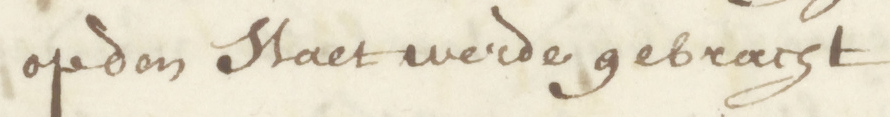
op den Staet werde gebracht
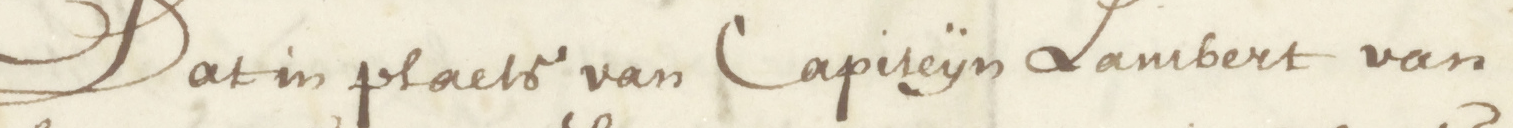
Dat in plaets van Capiteijn Lambert van
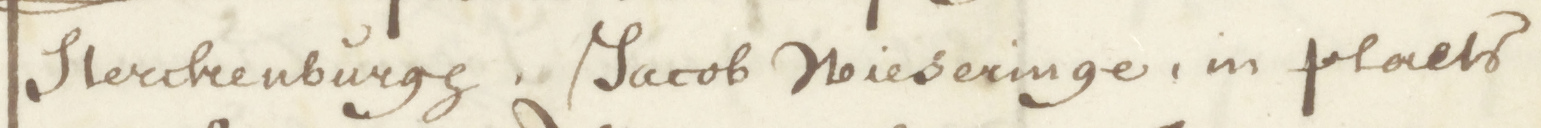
Sterckenburgh, Jacob Wieseringe, in plaets
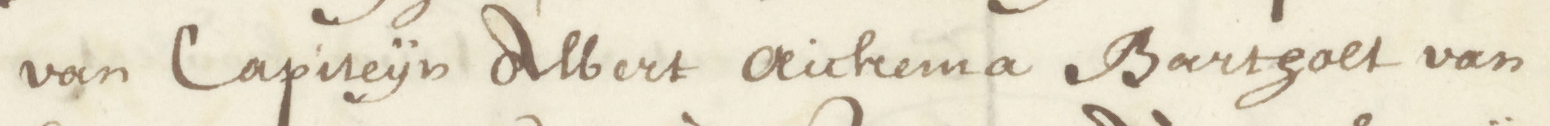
van Capiteijn Albert Aickema Bartholt van
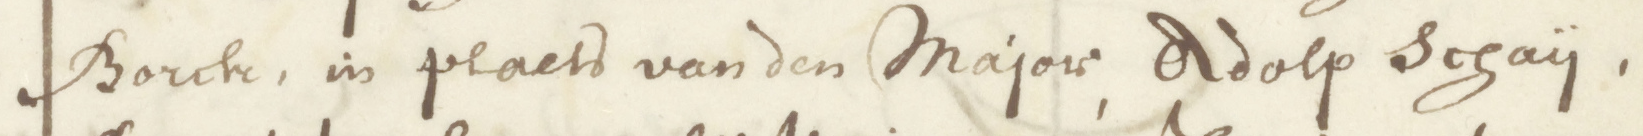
Borck, in plaets van den Major Adolp Schaij,
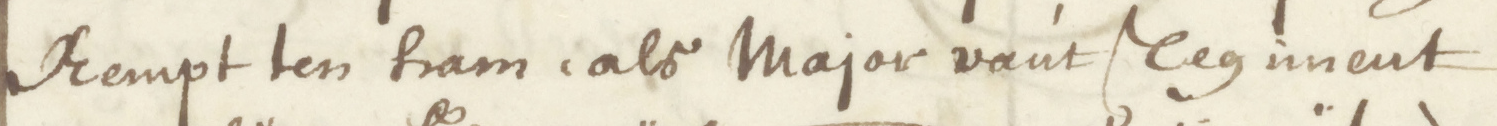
kempt ten ham, als Major vant Regiment
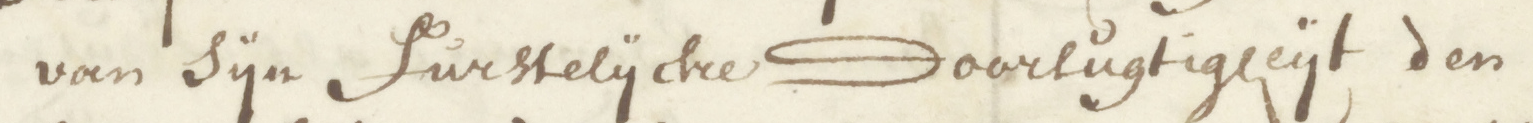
van sijn Furstelijcke Doorlugtigheijt den
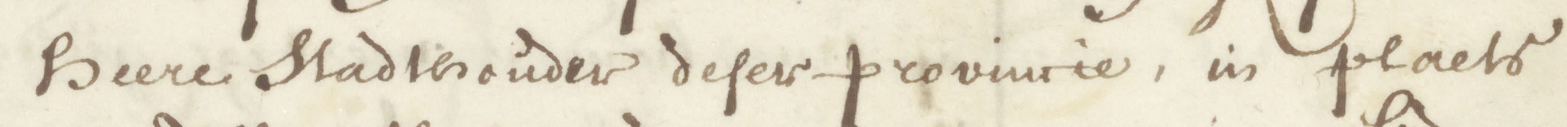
heere Stadthouder deser provincie, in plaets
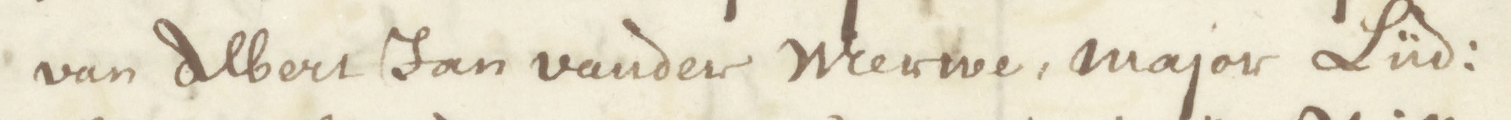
van Albert Jan vander Merwe, Major Lüd:
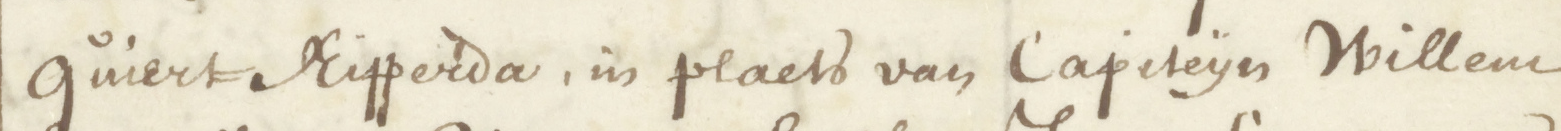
guiert Ripperda, in plaets van Capiteijn Willem
